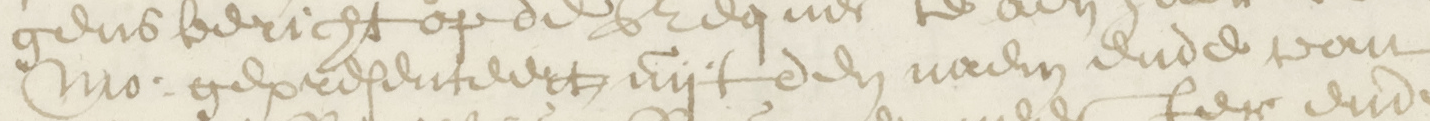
Mo: gepresenteert, uijt den naem ende van
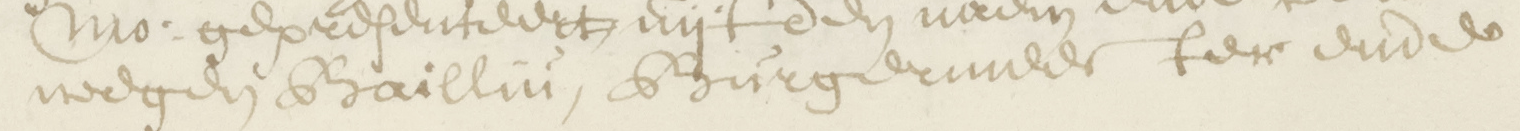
wegen Bailliu, Burgermeester ende
